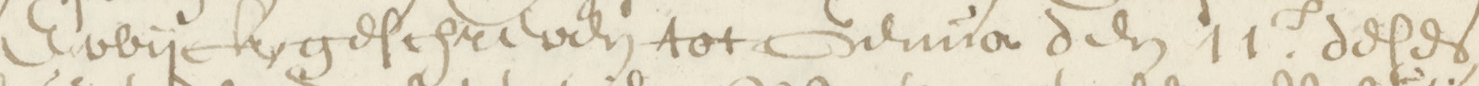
Ewijck, geschreven tot Genua den 11en. deses
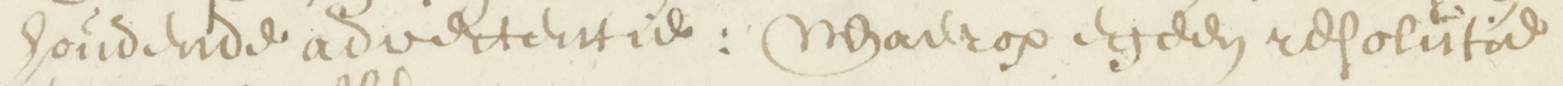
houdende advertentie: Waerop egeen resolutie
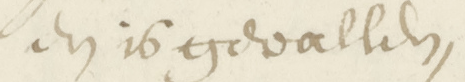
en is gevallen.
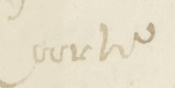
Coorte
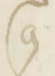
Ca.
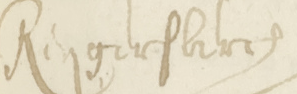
Reygersberch
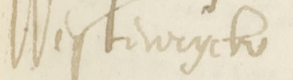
Westenrijck
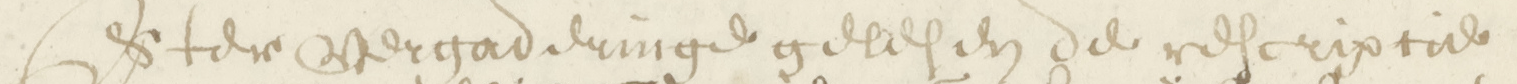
Is ter Vergaderinge gelesen de rescriptie
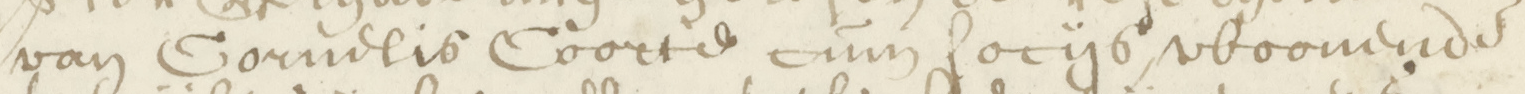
van Cornelis Coorte cum socijs, woonende
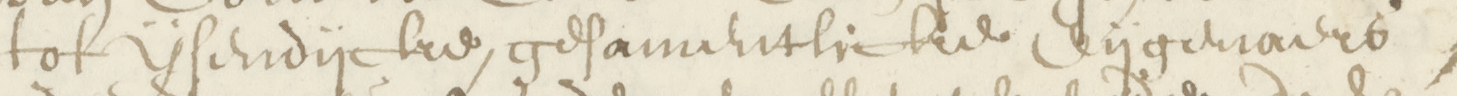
tot IJsendijcke, gesamentlicke Eijgenaers,
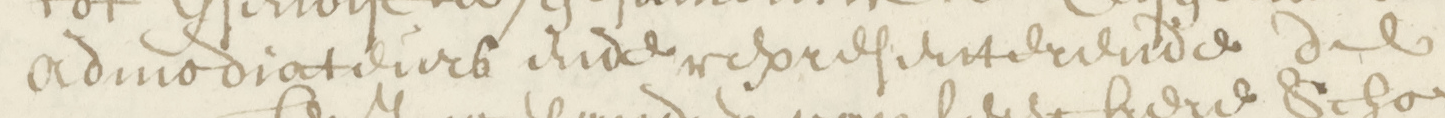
admodiateurs ende representerende de
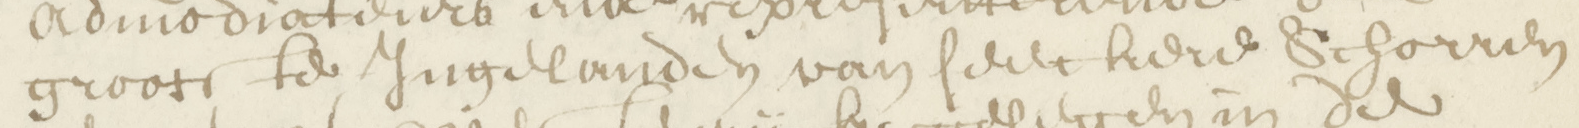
grootste Ingelanden van seeckere Schorren
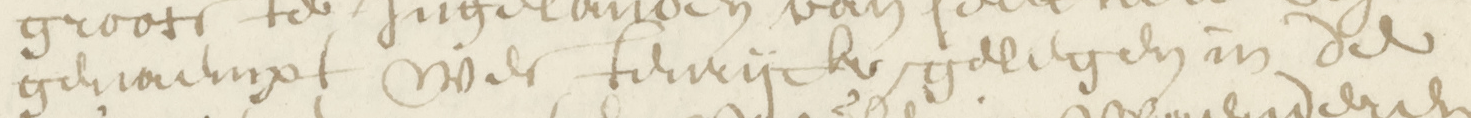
genaempt Westenrijck, gelegen in de
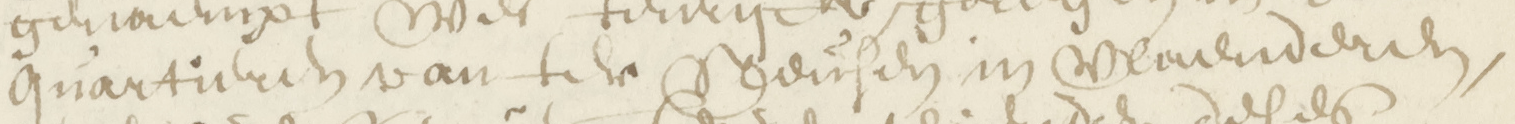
Quartieren van ter Neusen in Vlaenderen,
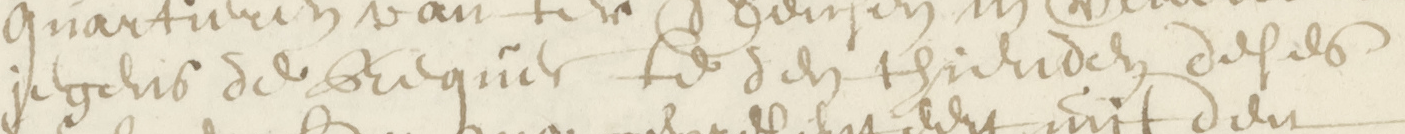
jegens de Requeste den thienden deses
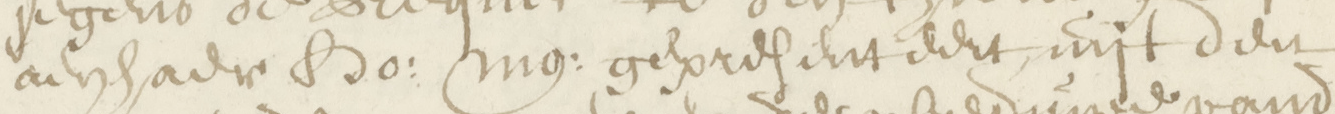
aen haer Ho:Mo: gepresenteert, uijt den
